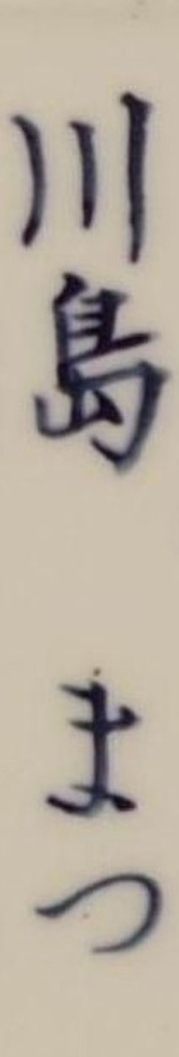川島まつ
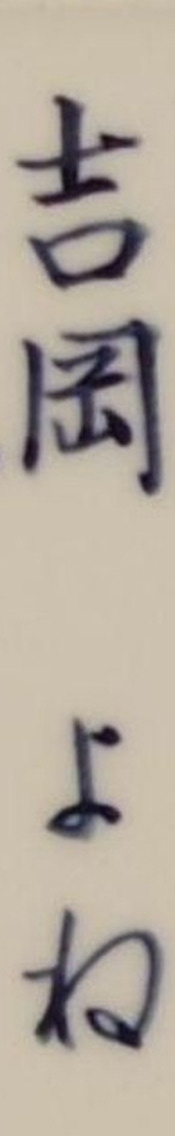吉岡よね
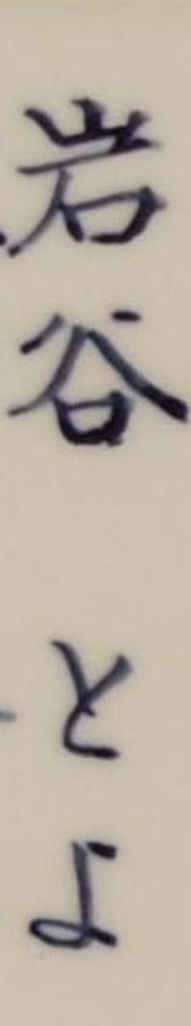岩谷とよ
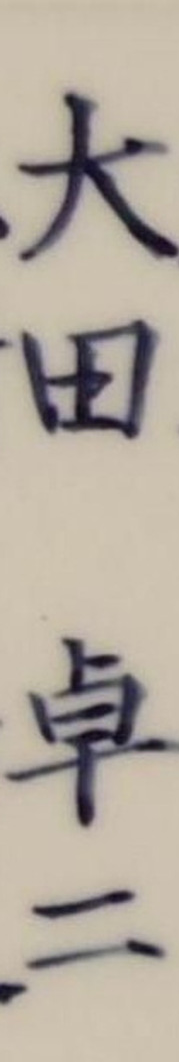大田卓二
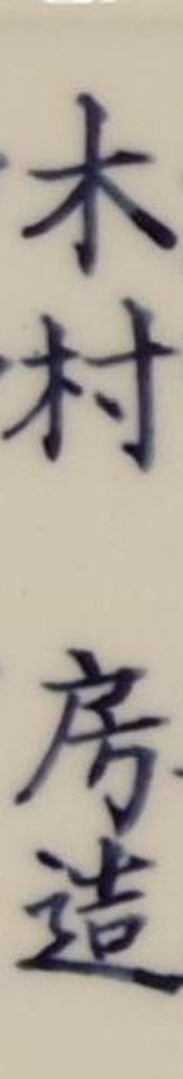木村房造
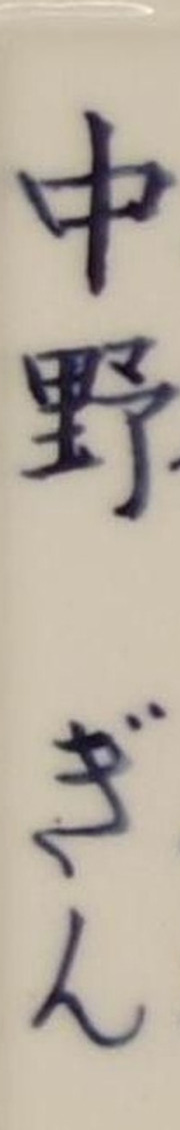中野ぎん

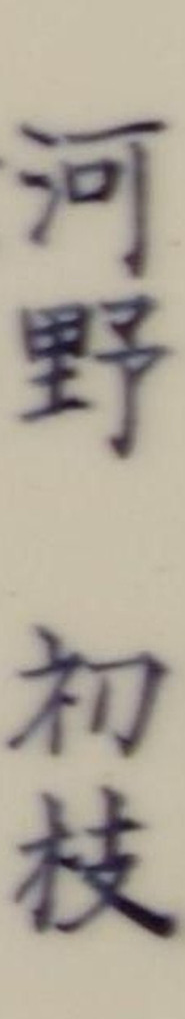河野初枝
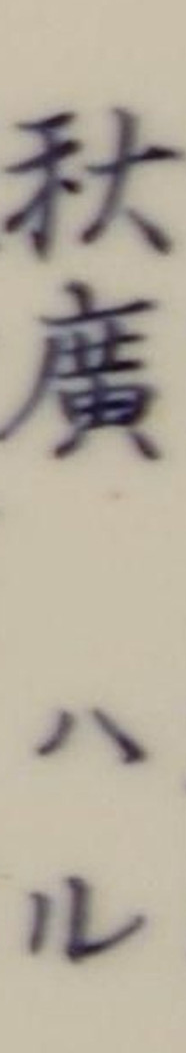秋廣ハル
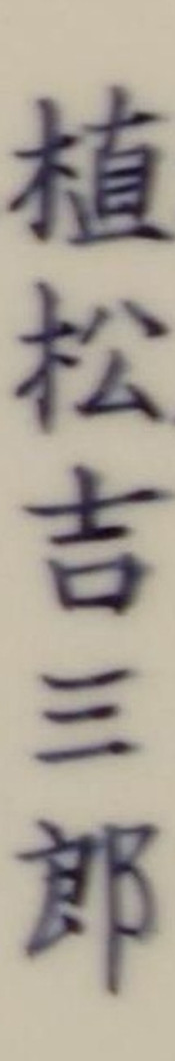植松吉三郎
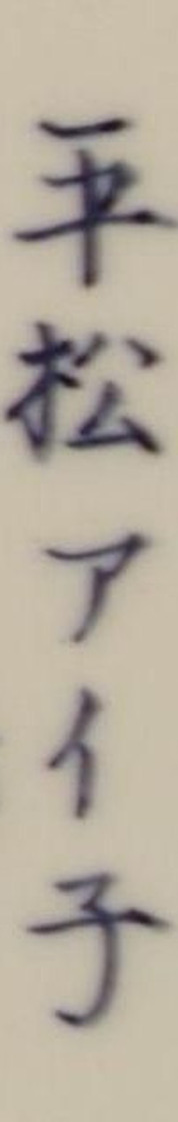平松アイ子
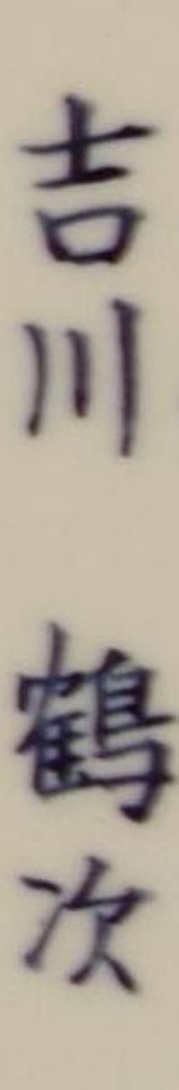吉川鶴次
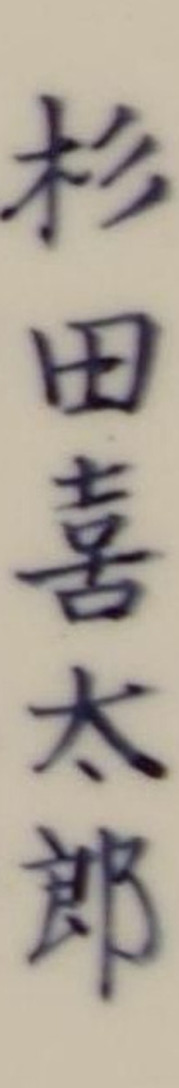杉田喜太郎
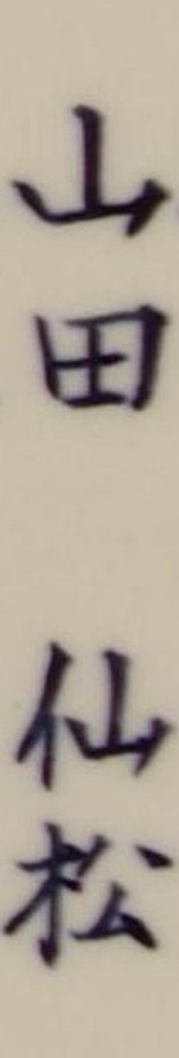山田仙松
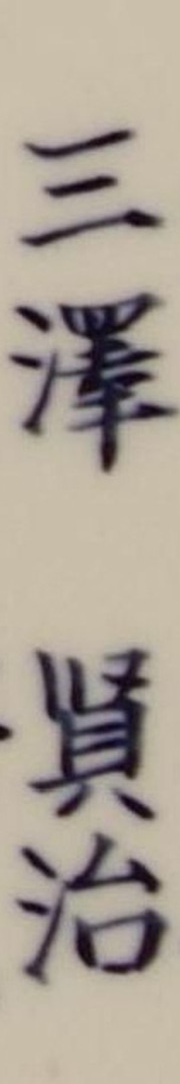三澤賢治
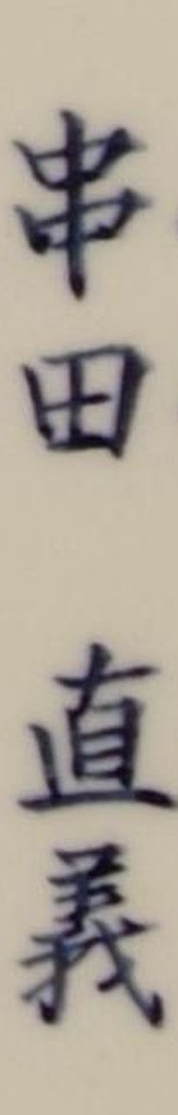串田直義
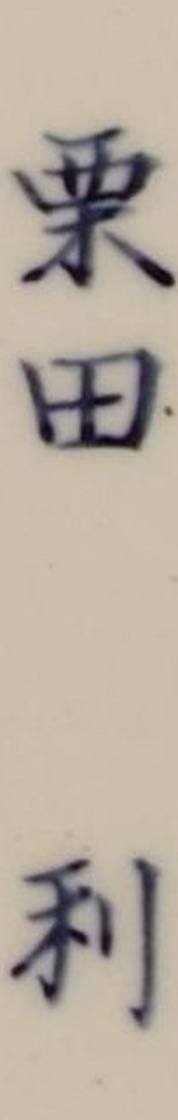栗田利
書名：M~S
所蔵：高野山金剛峯寺
